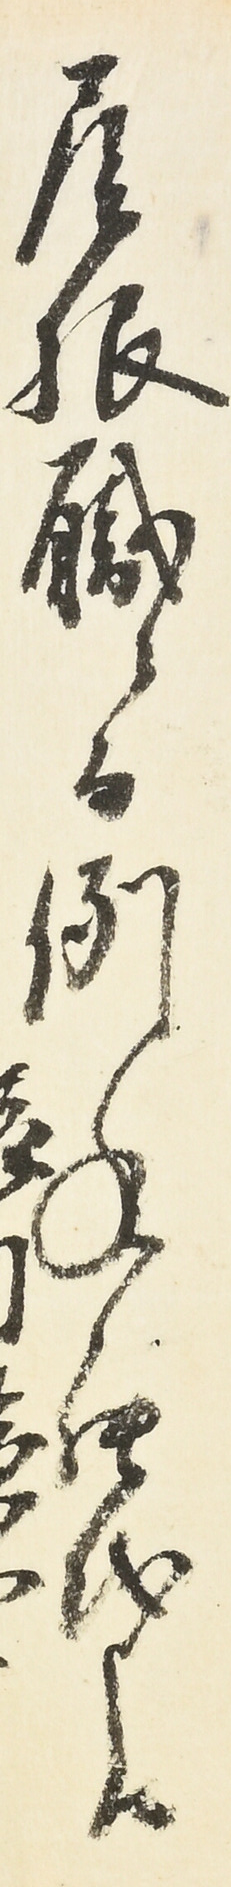屋根職ニ而例年罷越申候
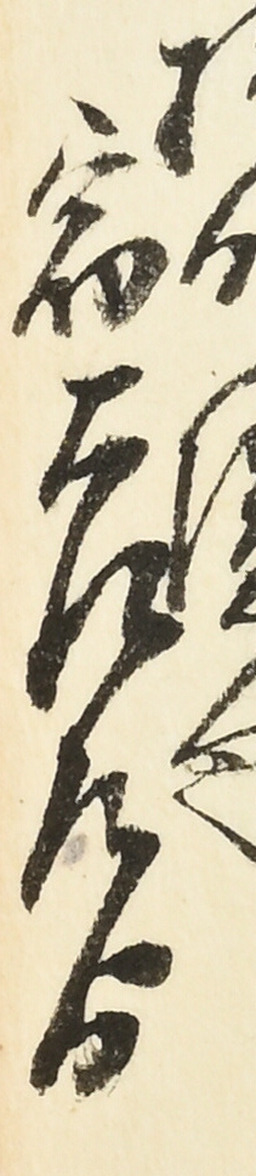宿吉左衛門
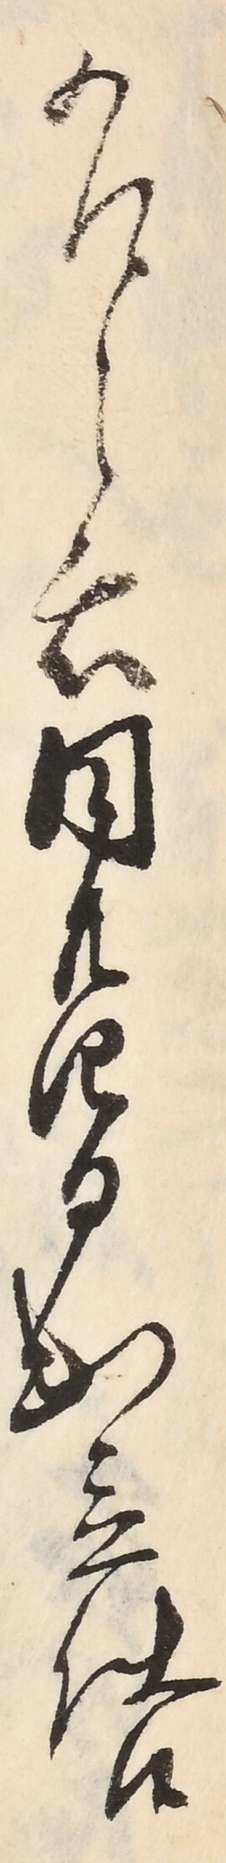右之者同廿九日出立仕候

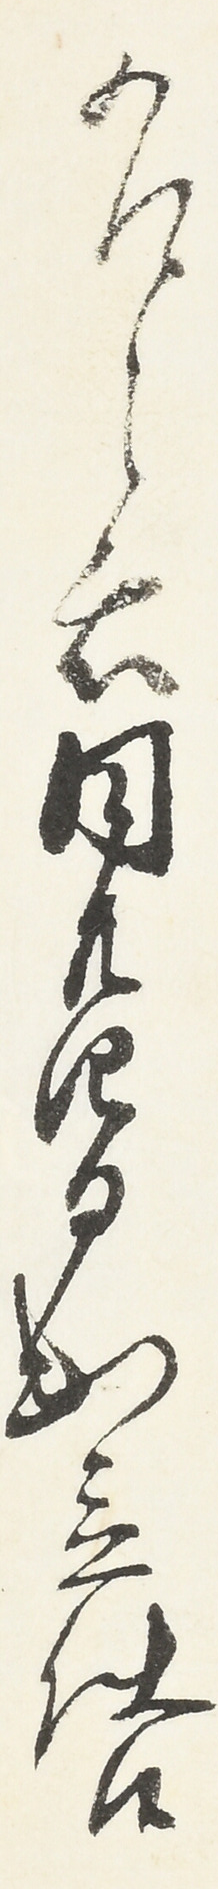右之者同廿四日出立仕候
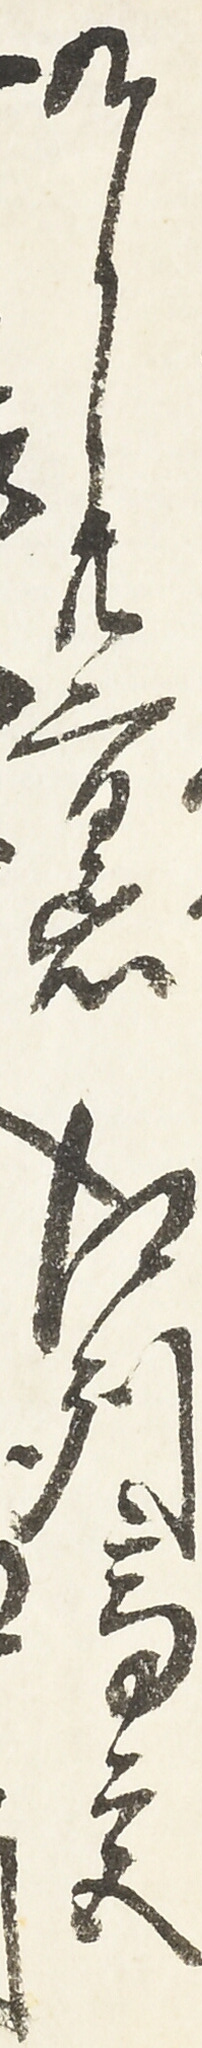九月廿二日着江州高宮
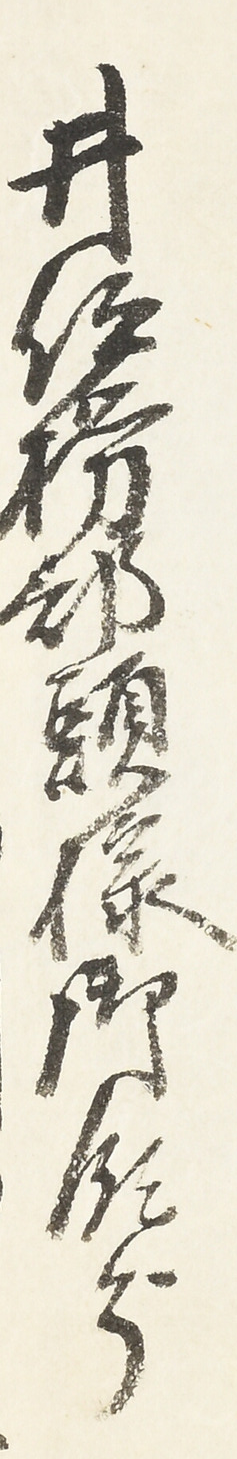井伊掃部頭様御領分
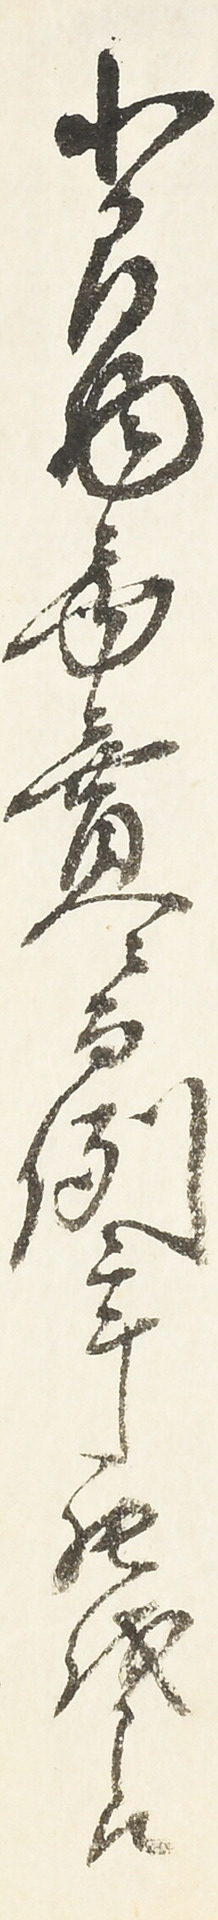小間物商売ニ而例年罷越申候
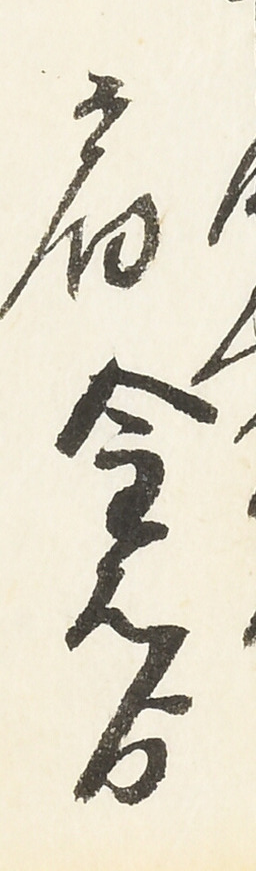宿金右衛門
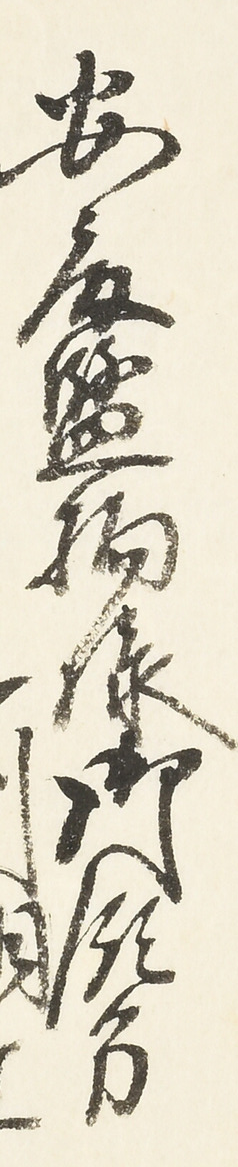安藤監物様御領分
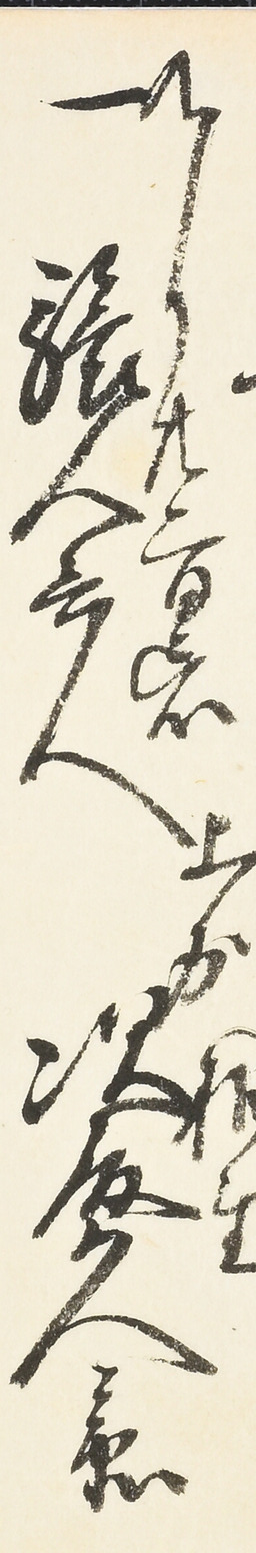一旅人壱人次藤久兵衛
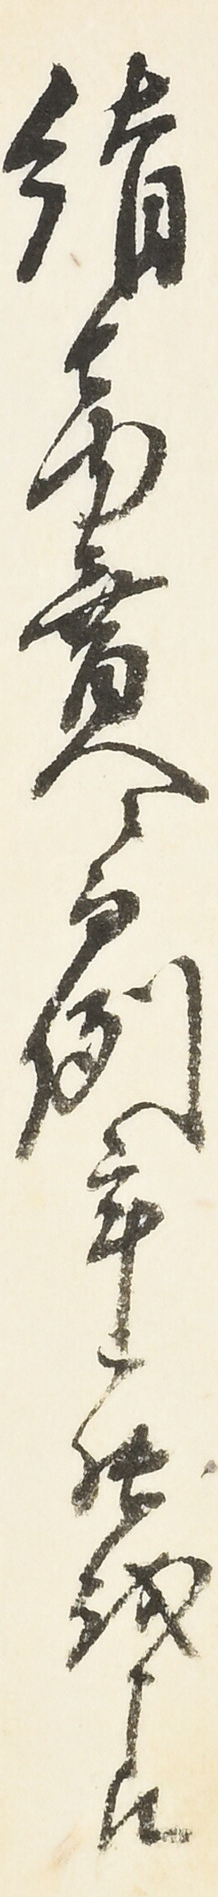絹商売ニ而例年罷越申候
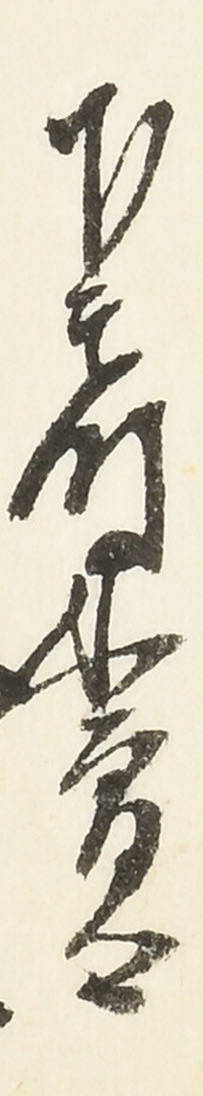下モ町木曽屋
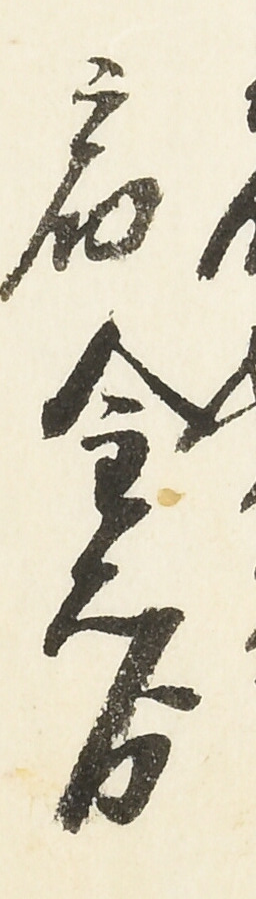宿金右衛門
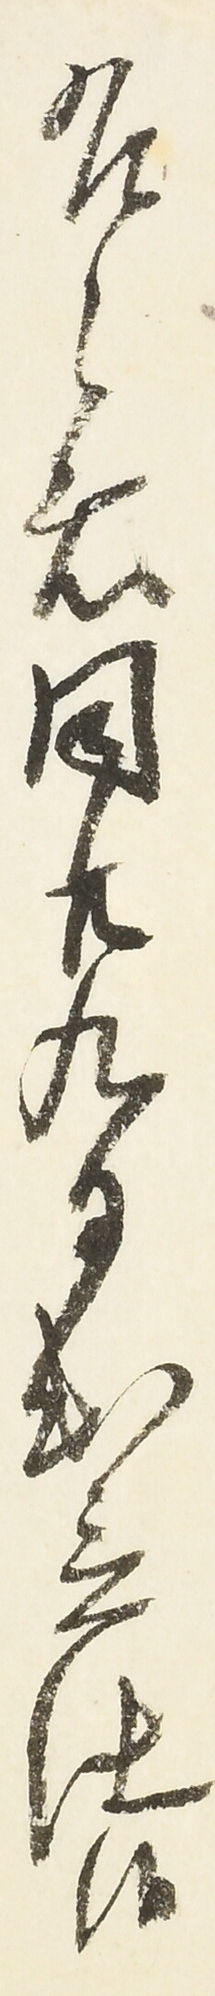右之者同廿九日出立仕候
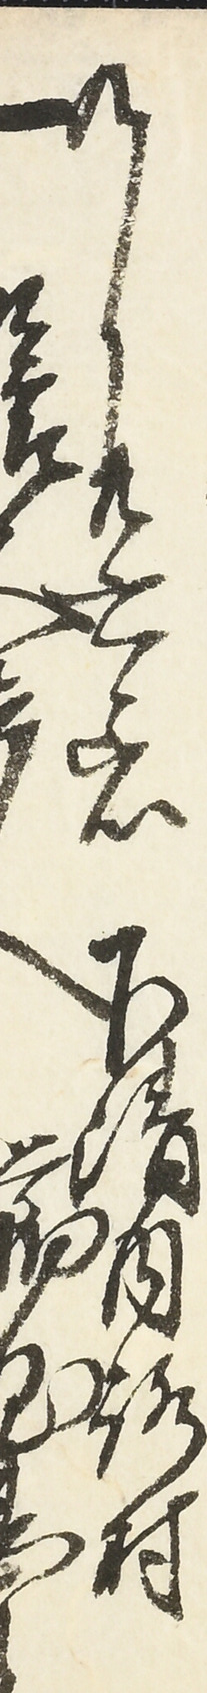九月廿六日着下清内路村
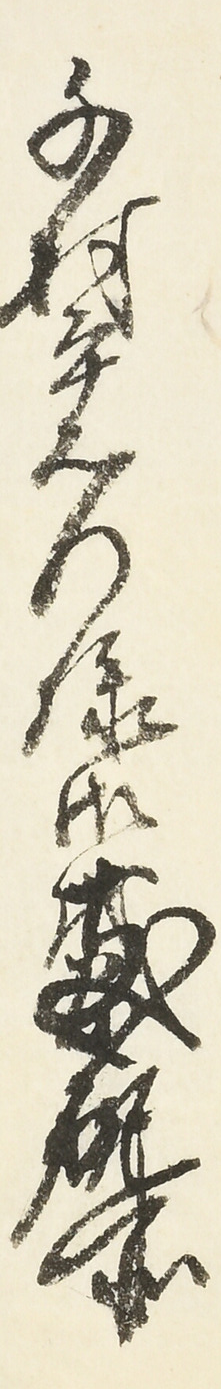千村平右衛門様御支配所
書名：町中旅人泊控帳
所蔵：伊那市立高遠町図書館・合同会社AMANE
